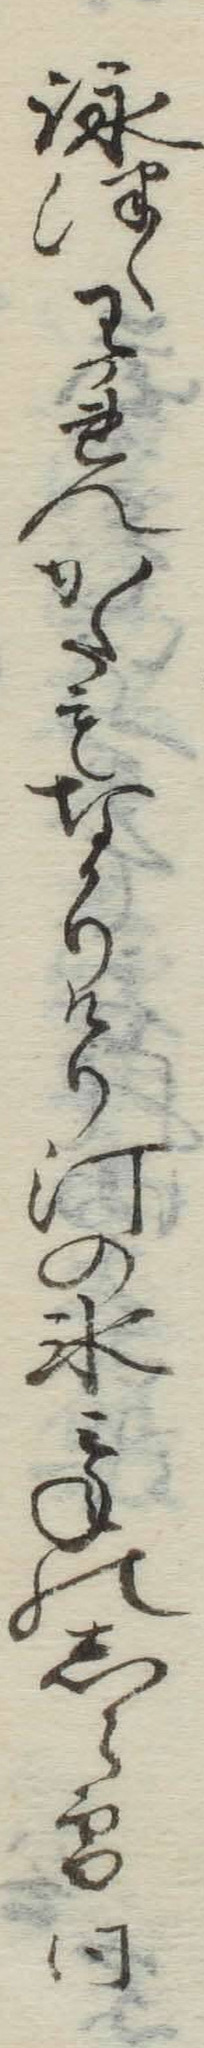詠つゝわかれんかたもなかりけり汀の氷みねのしら雪同
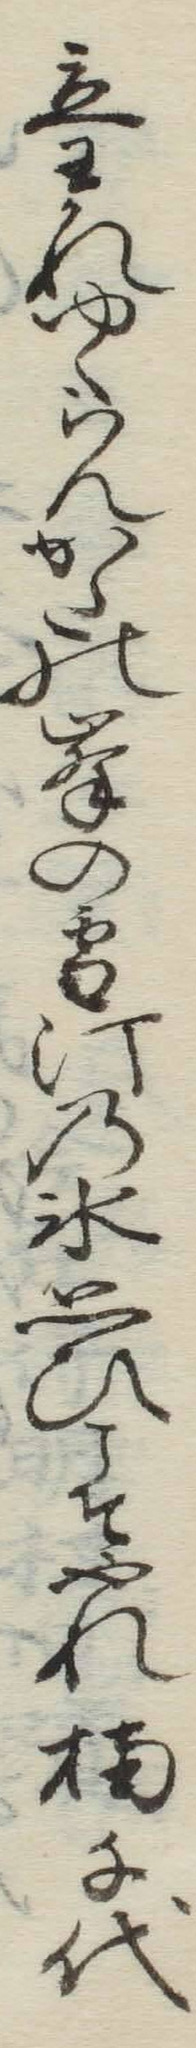立わかれゆくらんかたの峯の雪汀の氷思ひこそやれ楠千代
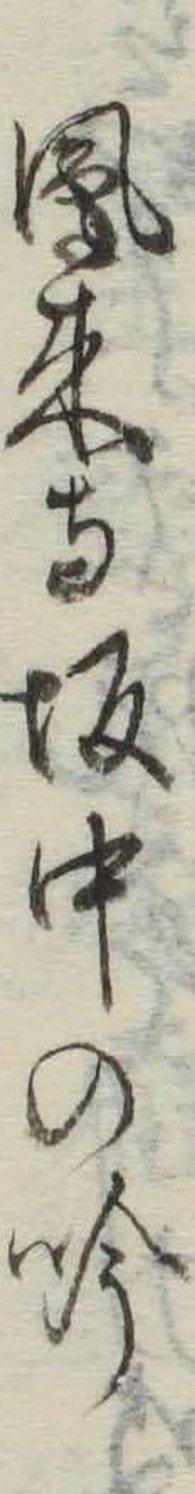鳳来寺坂中の吟
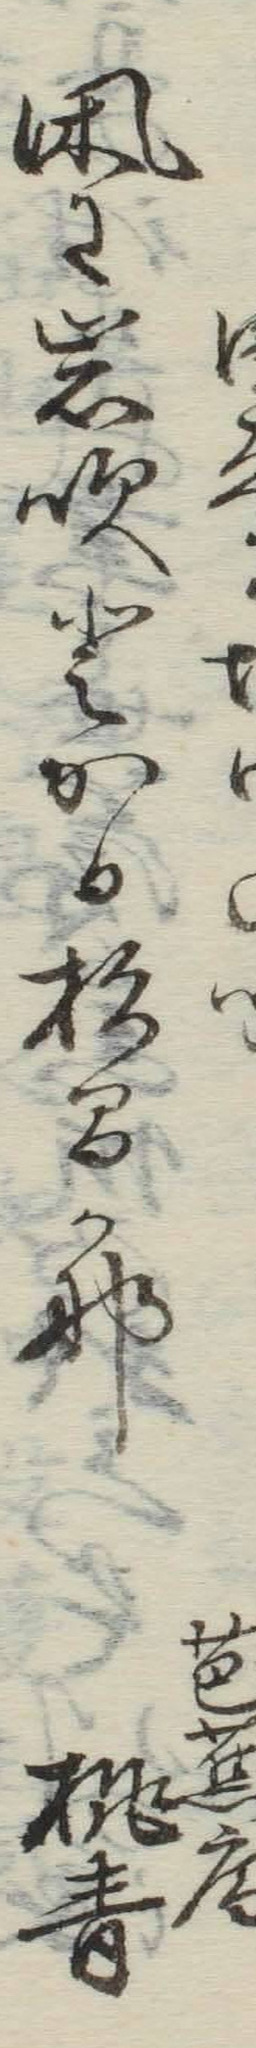凩に岩吹とかる杉間かな芭蕉庵桃青
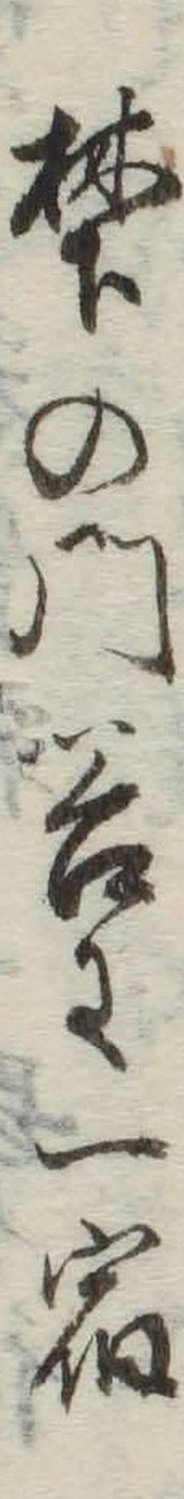麓の門谷に一宿
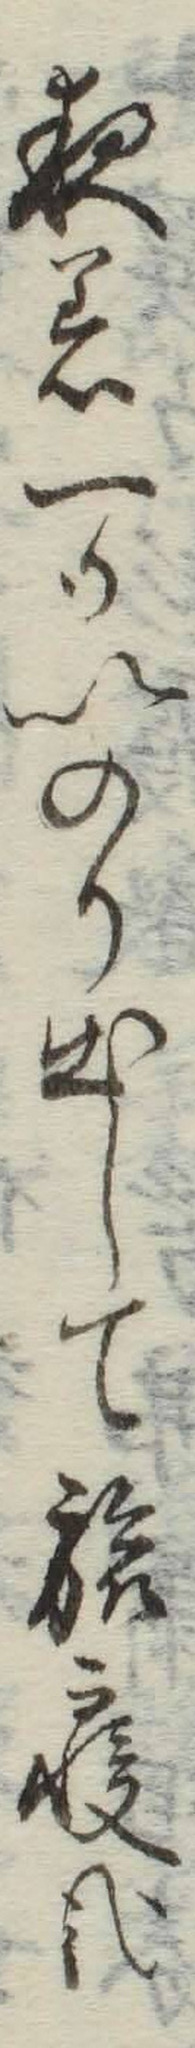夜着一ついのり出して旅寝哉同
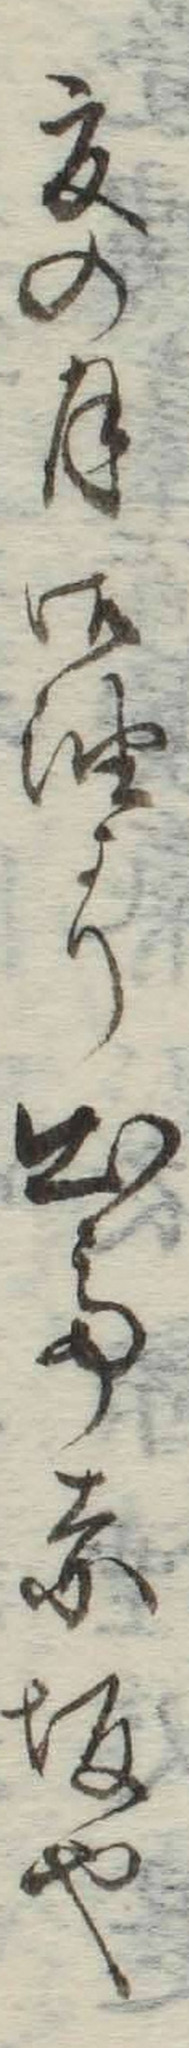夏の月御油より出て赤坂や同
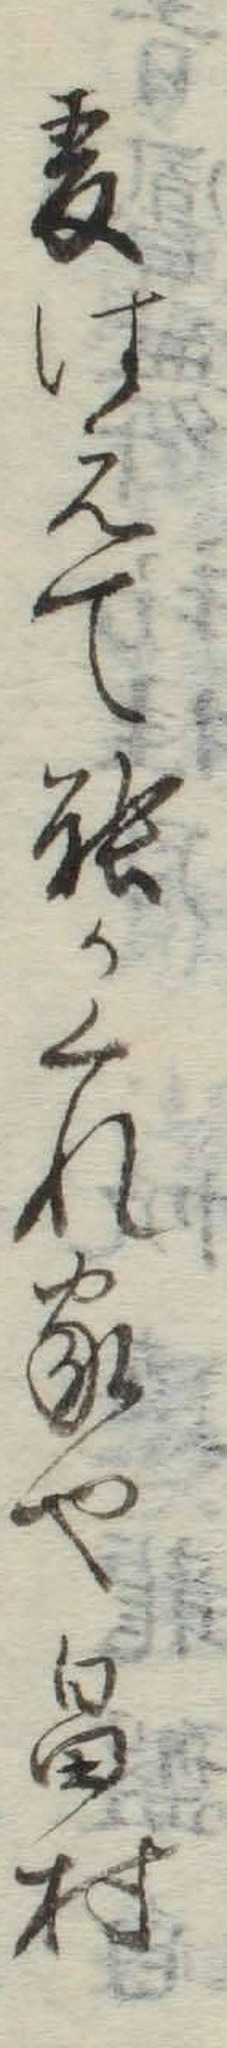麦はえて能かくれ家や畠村同
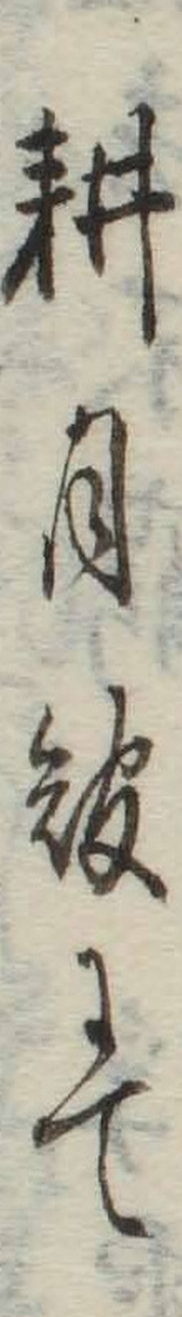耕月館にて
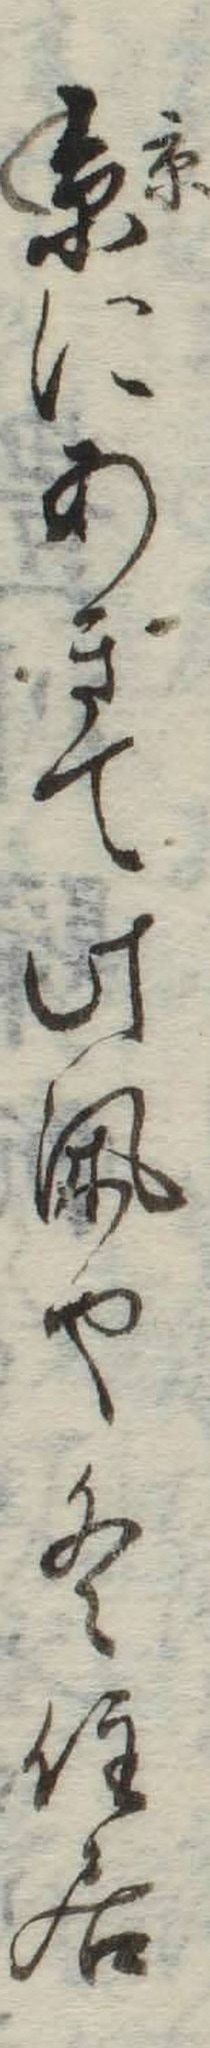京にあきて此凩や冬住居同
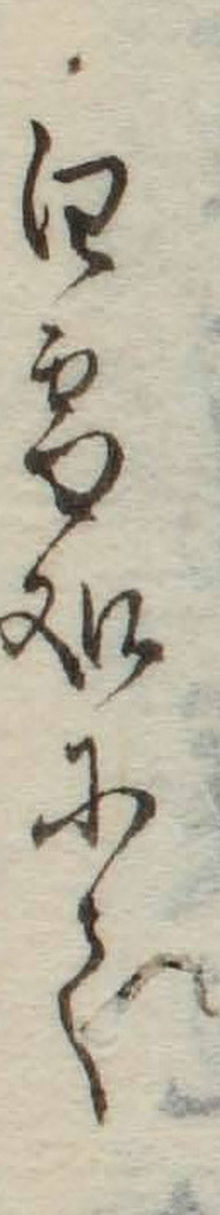白雪処にて
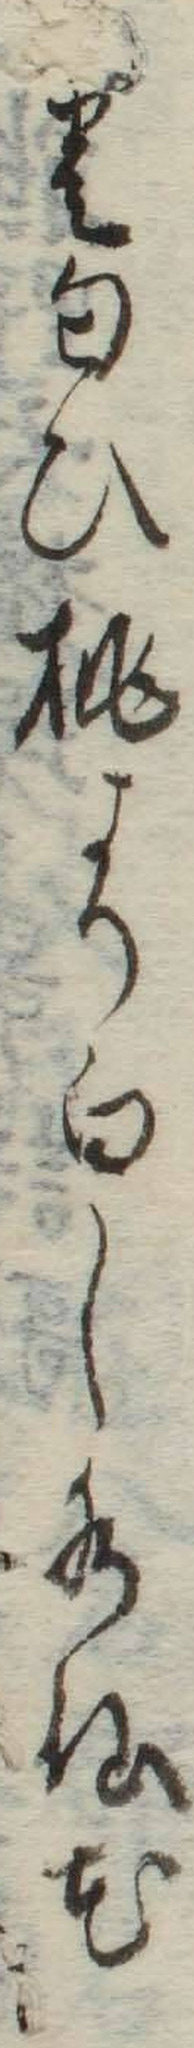其匂ひ桃より白し水仙花同

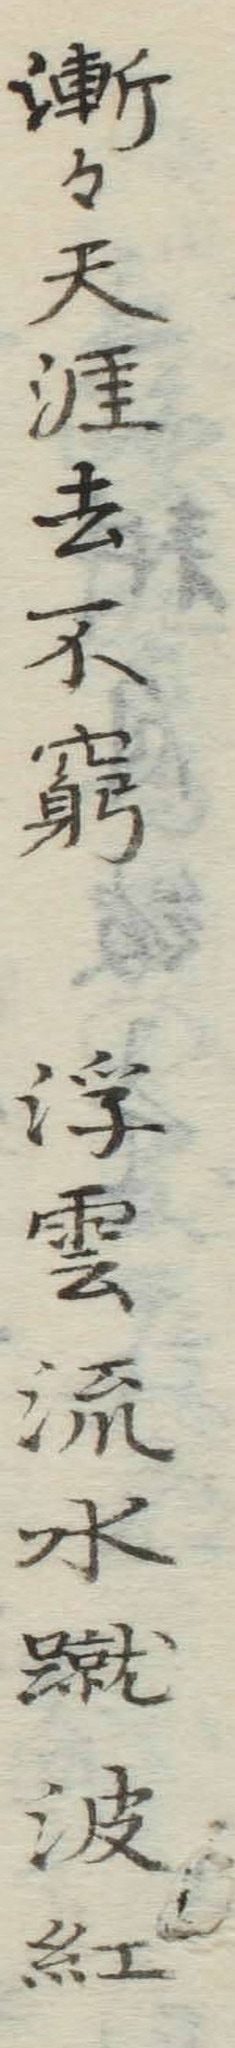漸々天涯去不窮浮雲流水蹴波紅
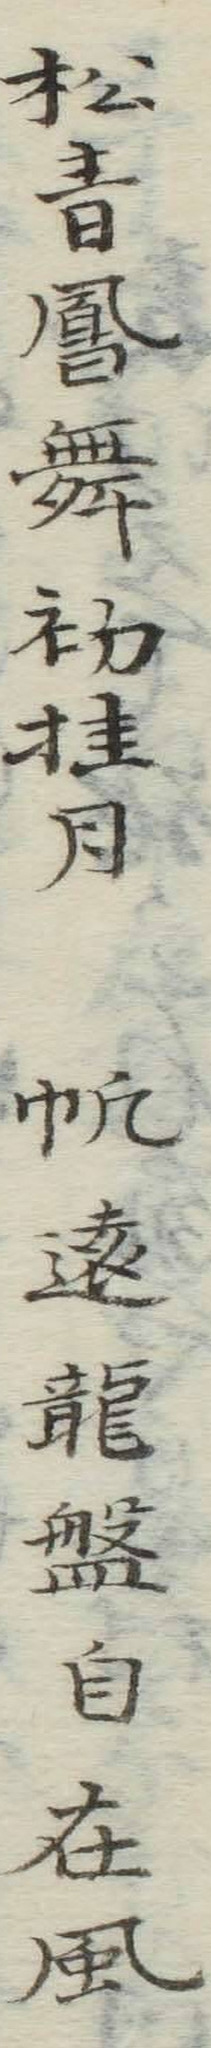松青鳳舞幼桂月帆遠龍盤自在風
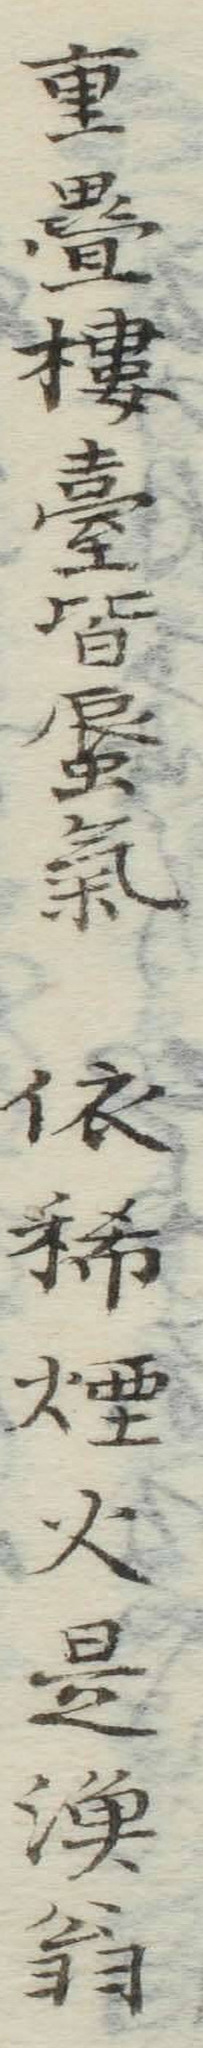重畳楼台皆蜃気依稀煙火是漁翁
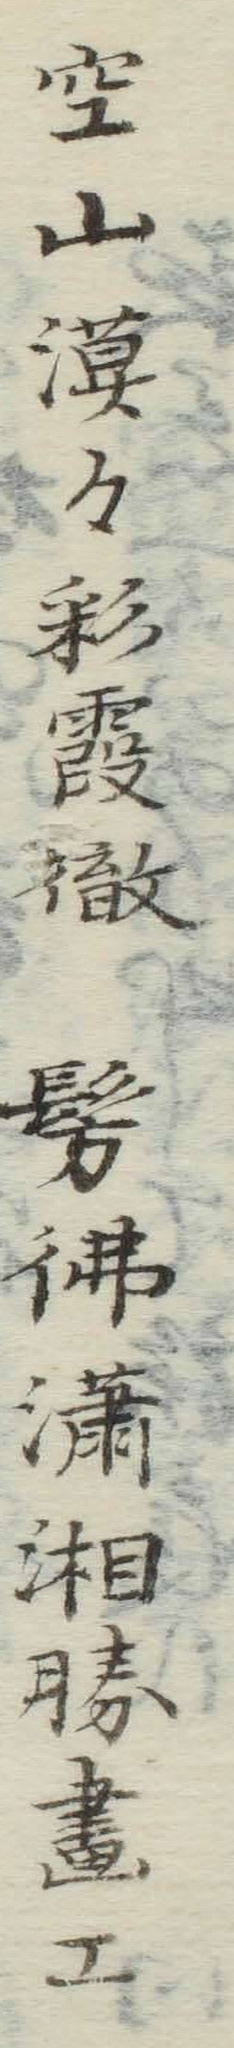空山漠々彩霞徹髣髴瀟湘勝画工
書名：三河国二葉松
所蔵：国文学研究資料館
